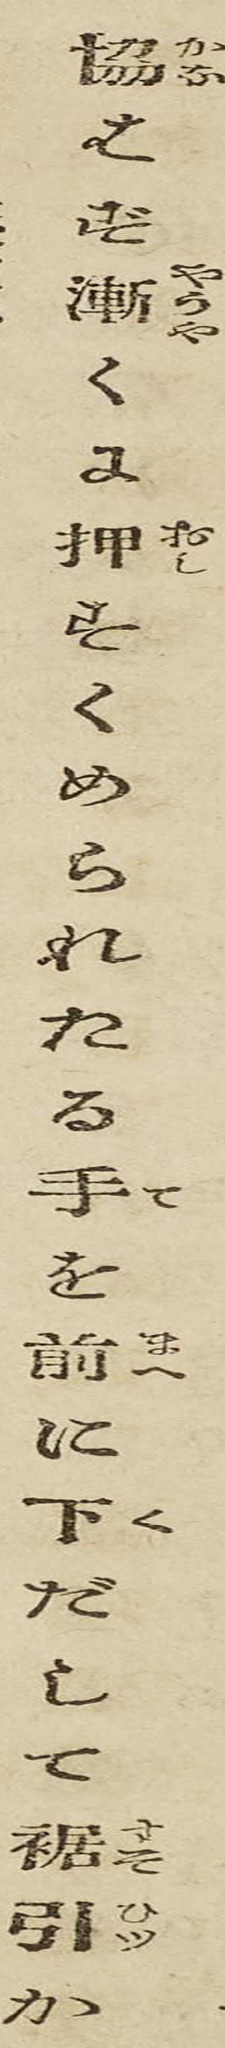協はず漸くに押すくめられたる手を前に下だして裾引か
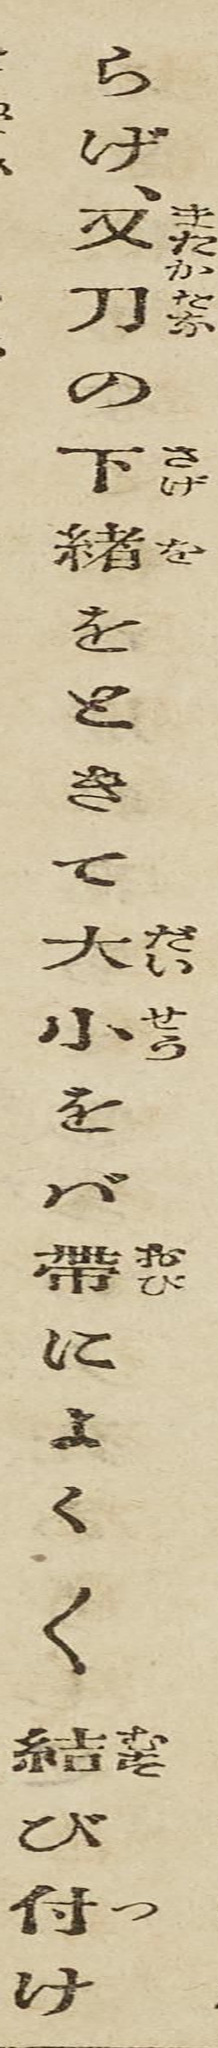らげ、又刀の下緒をときて大小をば帯によく〳〵結び付け
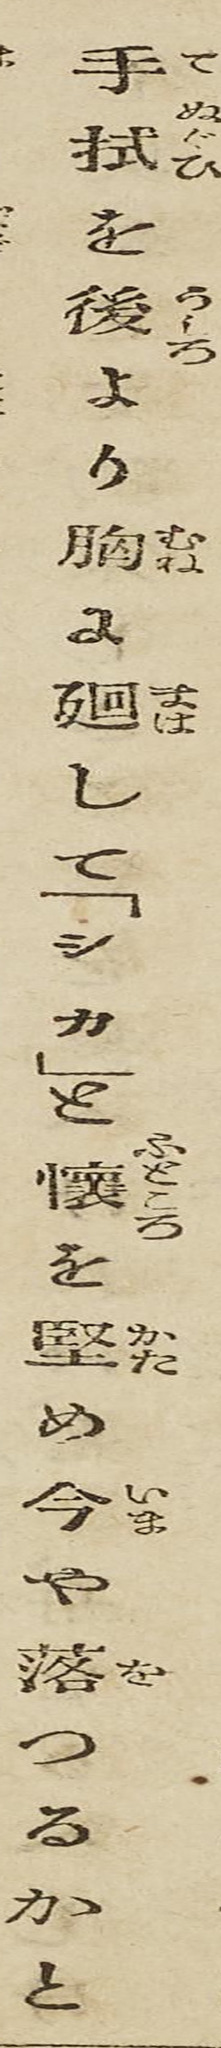手拭を後より胸に廻して「シカ」と懐を堅め今や落つるかと
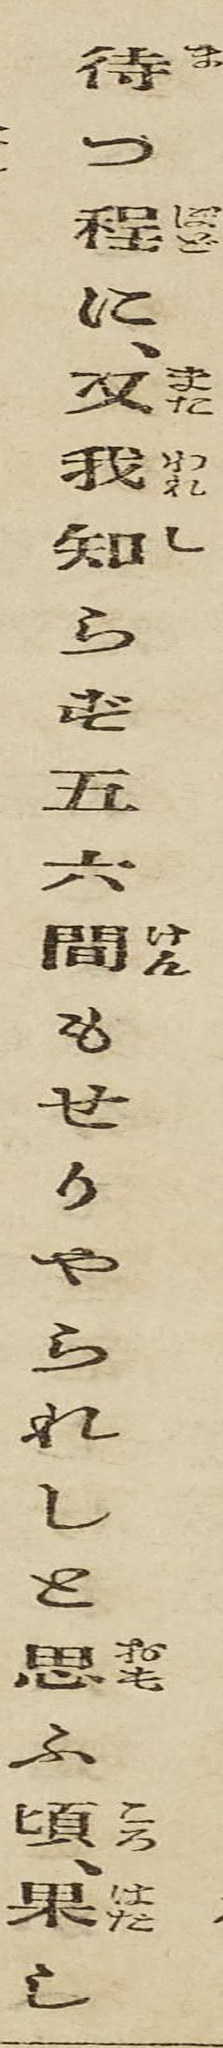待つ程に、又我知らず五六間もせりやられしと思ふ頃、果し
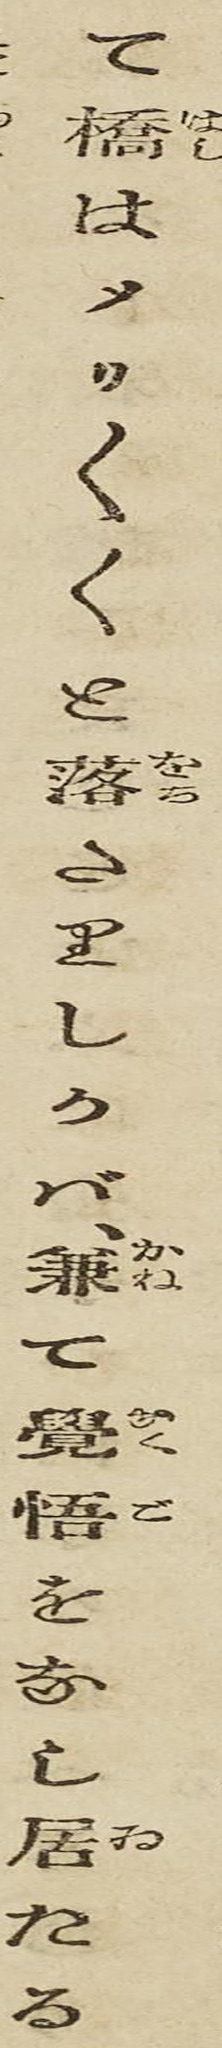て橋はメリ〳〵〳〵と落たりしかば、兼て覚悟をなし居たる
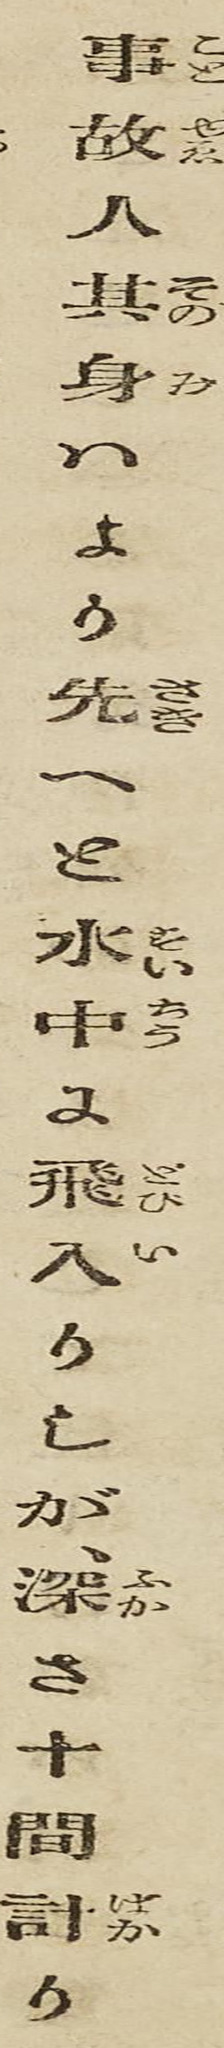事故人其身はより先へと水中に飛入りしが、深さ十間計り
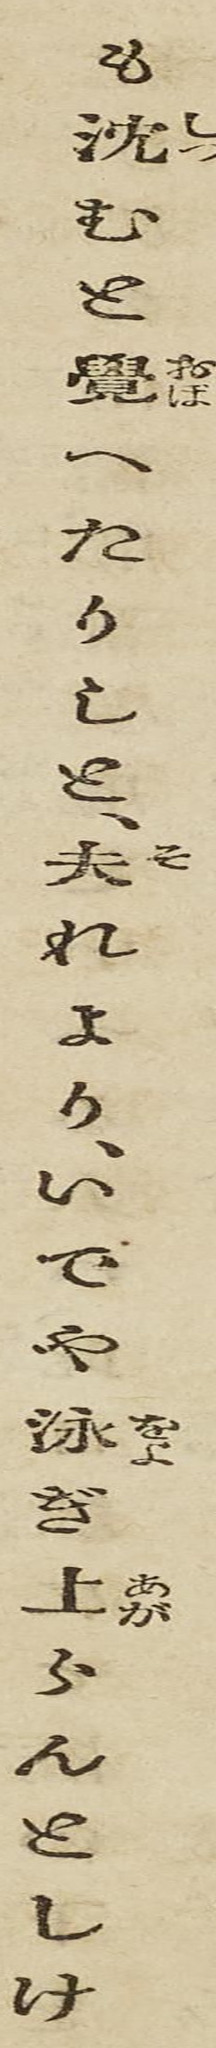も沈むと覚へたりしと、夫れより、いでや泳ぎ上らんとしけ
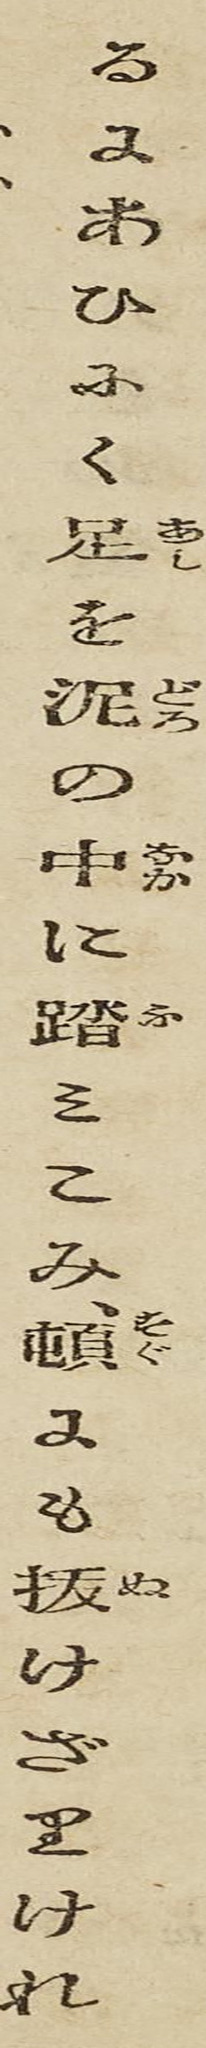るにあひにく足を泥の中に踏みこみ、頓にも抜けざりけれ
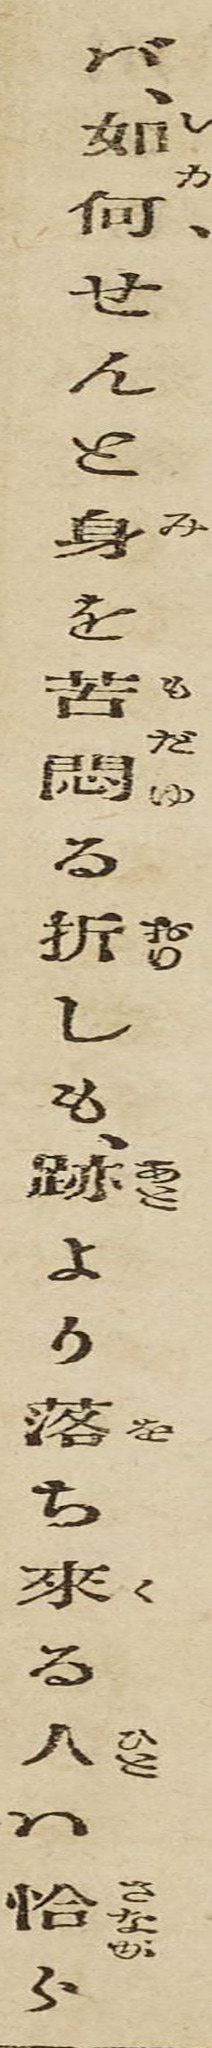ば、如何せんと身を苦悶る折しも、跡より落ち来る人は恰ら
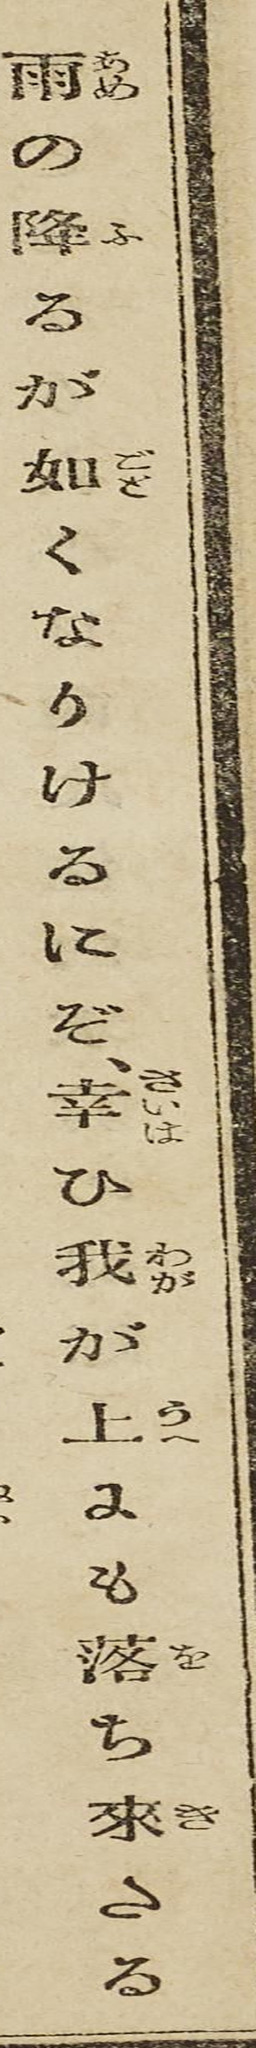雨の降るが如くなりけるにぞ、幸ひ我が上にも落ち来たる
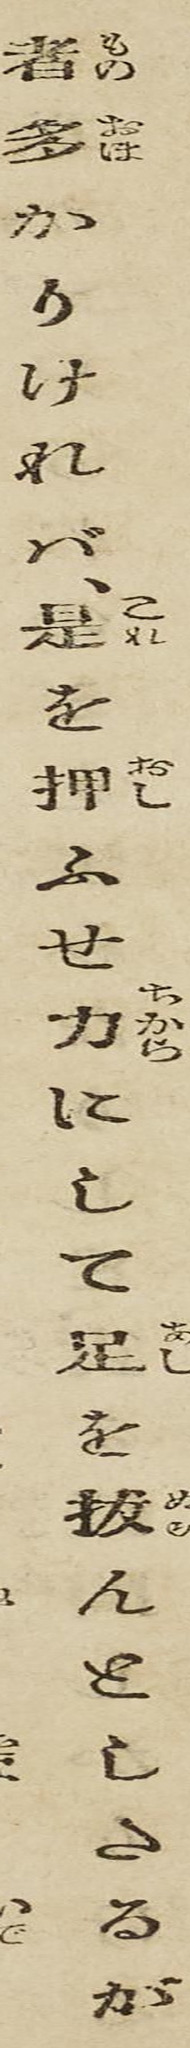者多かりければ、是を押ふせ力にして足を抜んとしたるが
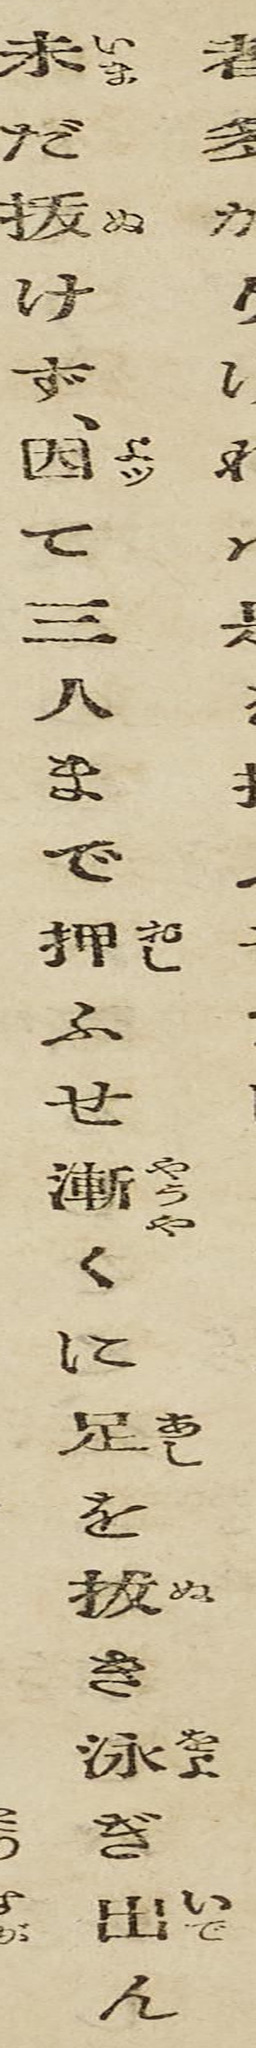未だ抜けず、因て三人まで押ふせ漸くに足を抜き泳ぎ出ん
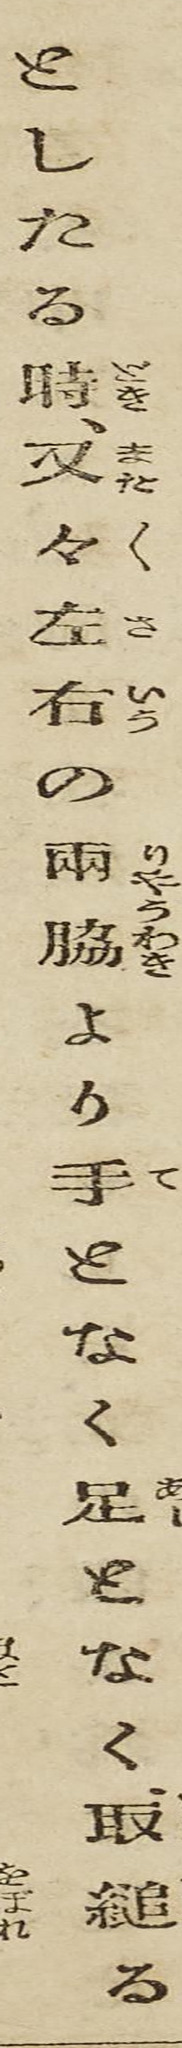としたる時、又々左右の両脇より手となく足となく取縋る
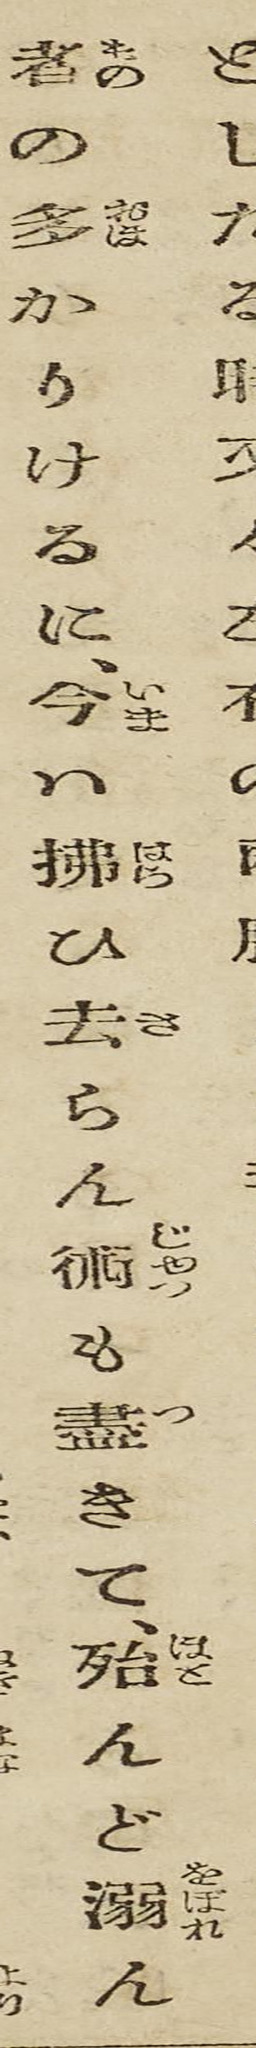者の多かりけるに、今は払ひ去らん術も尽きて、殆んど溺ん
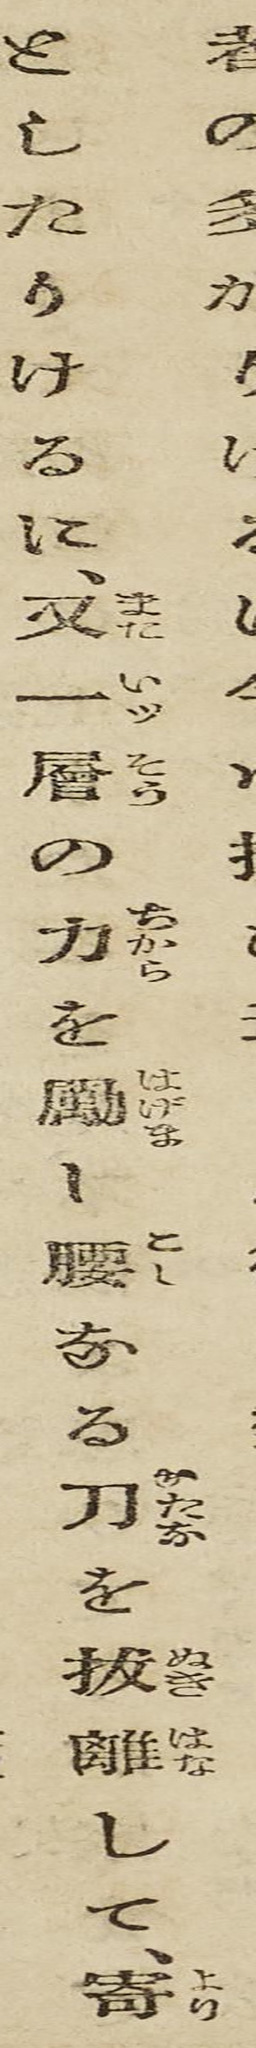としたりけるに、又一層の力を励し腰なる刀を抜離して、寄
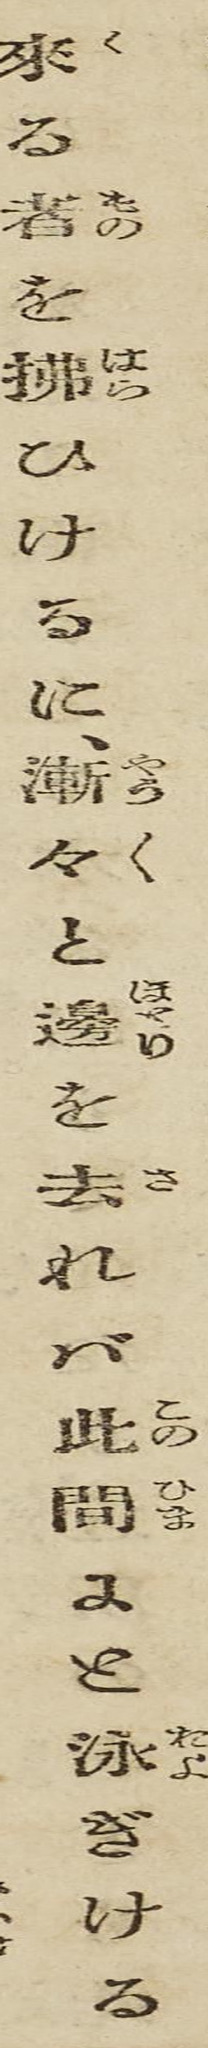来る者を払ひけるに、漸々と辺を去れば此間にと泳ぎける
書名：永代惨話　文化の夢　全
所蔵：東京大学地震研究所図書室 Earthquake Research Institute Library, The University of Tokyo, JAPAN
